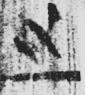之
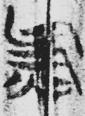○（氣）
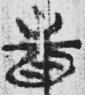眚（性）
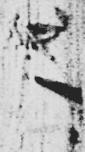也
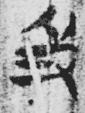及
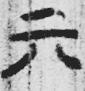亓（其）
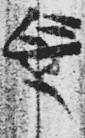見
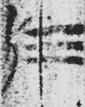於
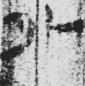外
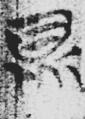鼎（則）
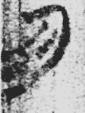勿（物）
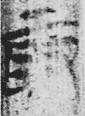取
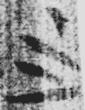之
